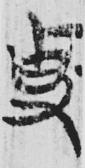史（事）
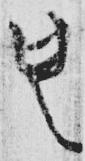也
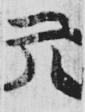亓（其）
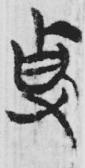史（使）
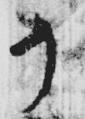人
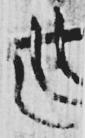必
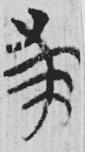求
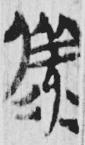備
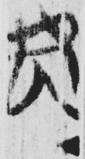𡚦（焉）
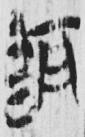○（聞）
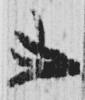之
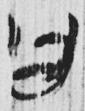曰
